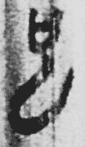也
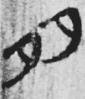多
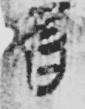言
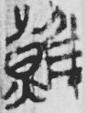難
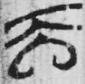而
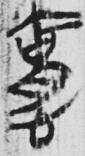惋（怨）
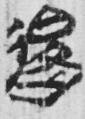退（懟）
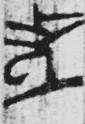者
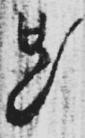也
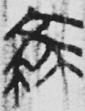衰
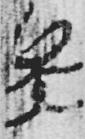矣
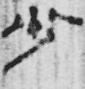少（小）
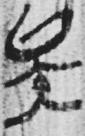矣
